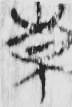東
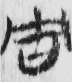周
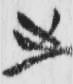之
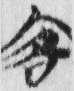客
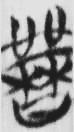○（許）
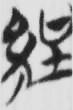○（盈）
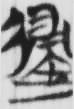歸
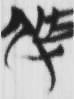{尸拃}（胙）
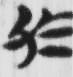於
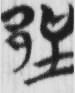郢
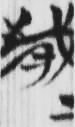歲
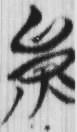○（爨）
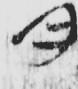月
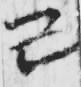己
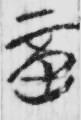梄（酉）
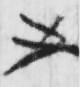之
